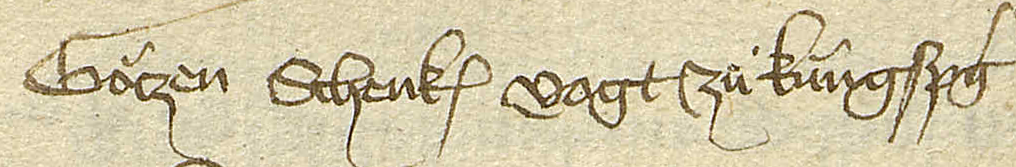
Göcʒen Schenk* vogt cʒü küngſpg*
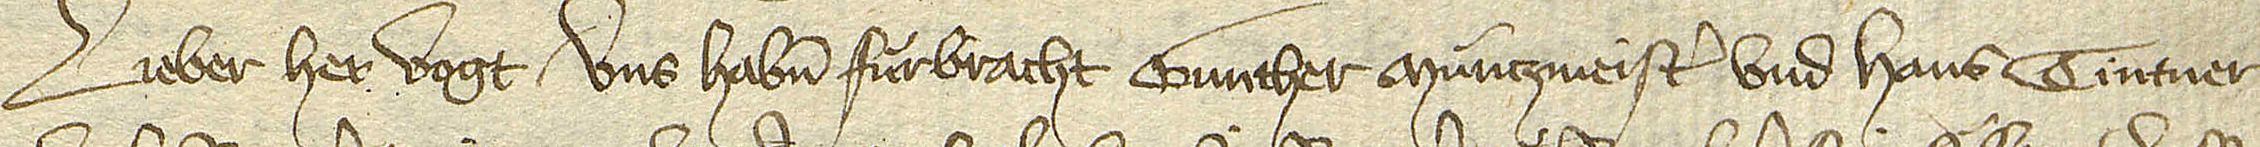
Lieber her vogt / vns habn* fürbracht Gunther Müncʒmeiſt* vnd hans Tintner
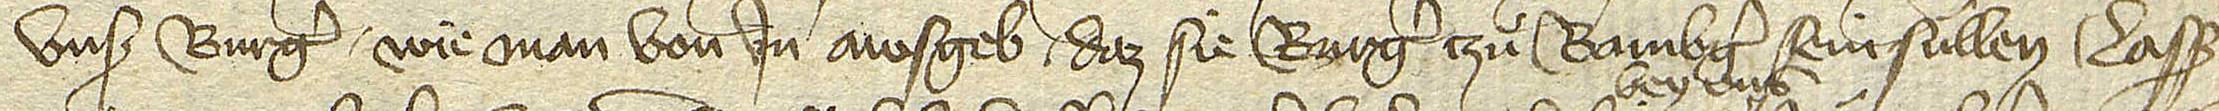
vnſ* Burg* / wie man von In awſgeb / daʒ ſie Burg* cʒu Bambg* ſein ſüllen / Laſſ*
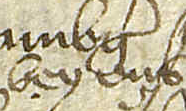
bey vns
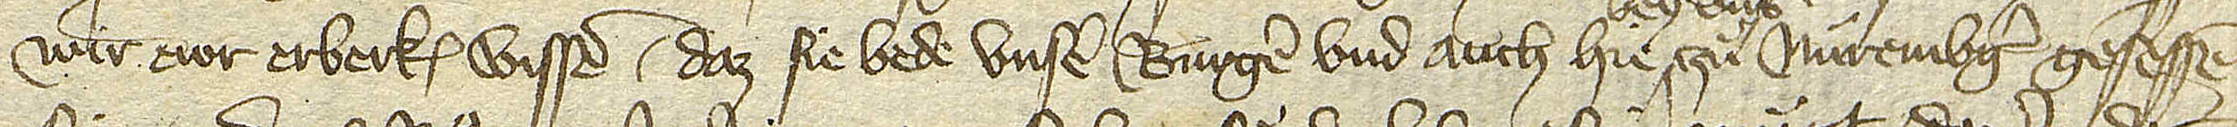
wir ewr erberk* wiſſe* / daʒ ſie bede vnſe* Burge* vnd auch hie cʒü Nürembg* geſeſſe*
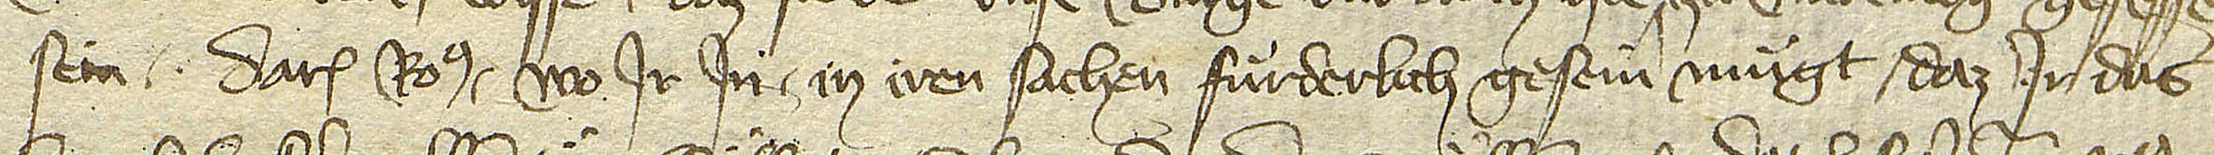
ſein / . dar* Ro* / wo Ir In / in iren ſachen fürderlich geſein mügt / daʒ Ir das
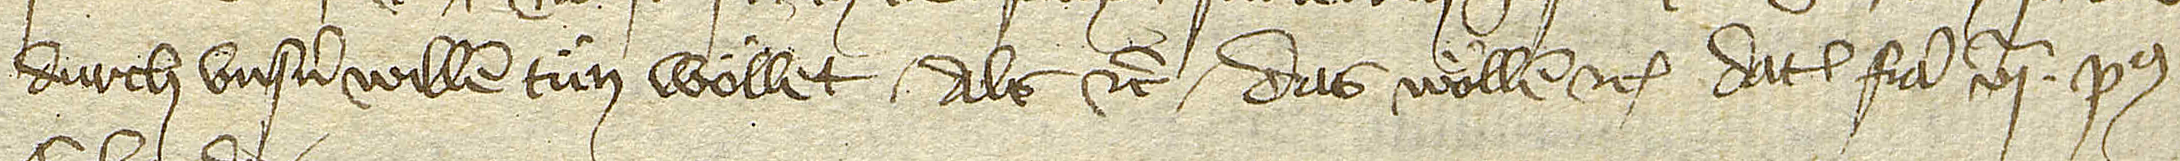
durch vnſn* wille* tün wöllet / Als ec* / Das wölle* ec* dat* vi* . p*
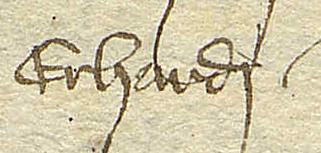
Erhardi / .
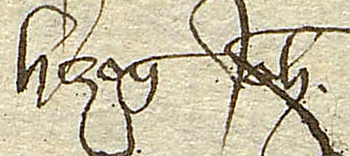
h*cʒog Ioh*.
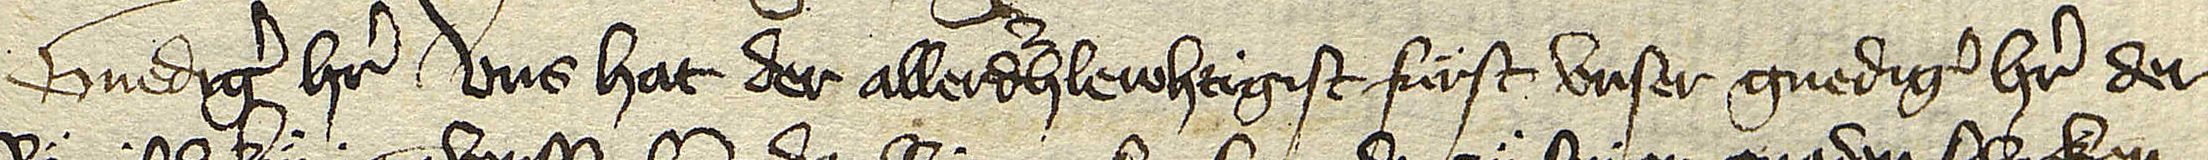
Gnedig* hr* / Vns hat der allerd*hlewhtigiſt fürſt vnſer gnedig* hr* der
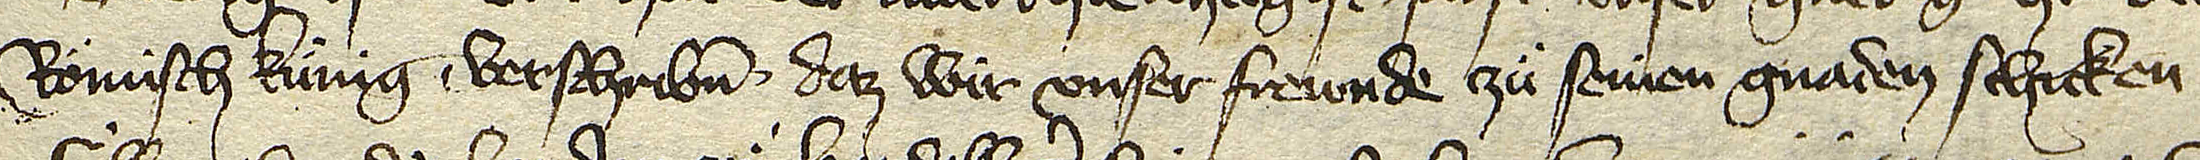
Römiſch künig / verſchribn* / daʒ wir vnſer freunde cʒü ſeinen gnaden ſchicken
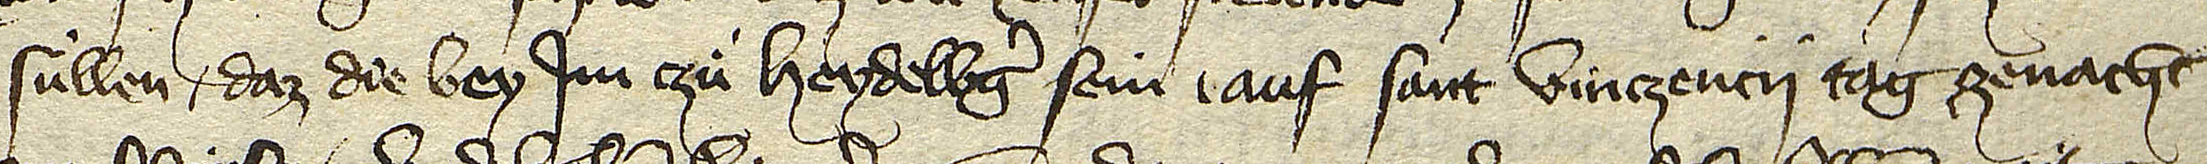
ſüllen / daʒ die bey Im cʒü heydelbg* ſein / auf ſant vincʒencii tag cʒenacht
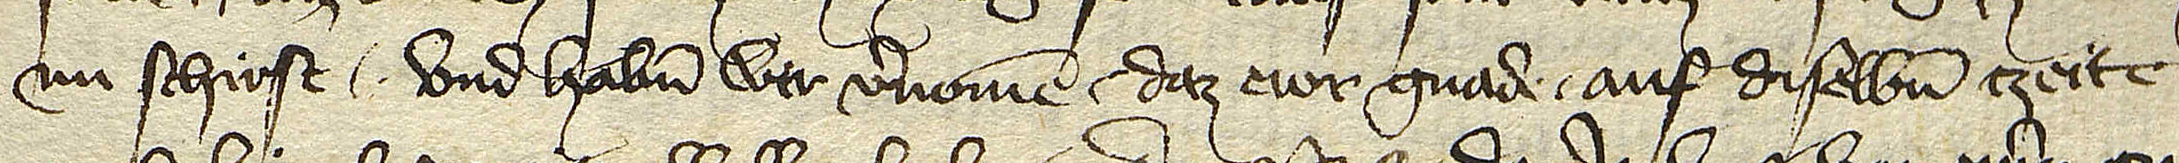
nu ſchirſt / . vnd habn* wir v*nome* / daʒ ewr gnade / auf diſelbn* cʒeite
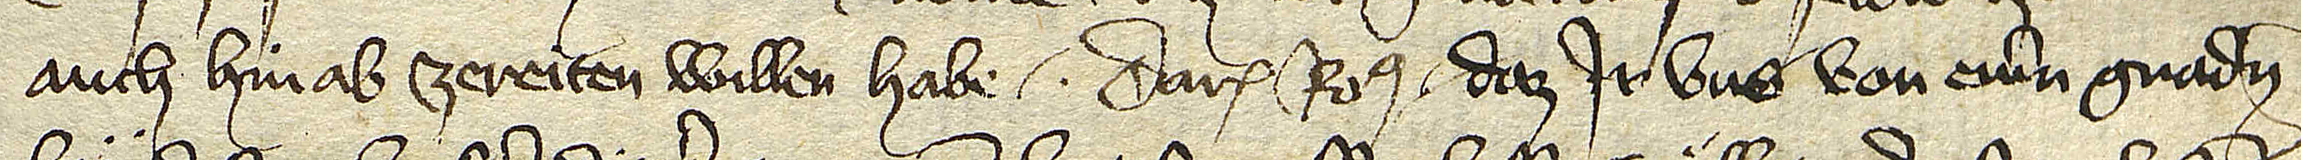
auch hin ab cʒereiten willen habe / . Dar* Ro* / daʒ Ir vns von ew*n gnadn*
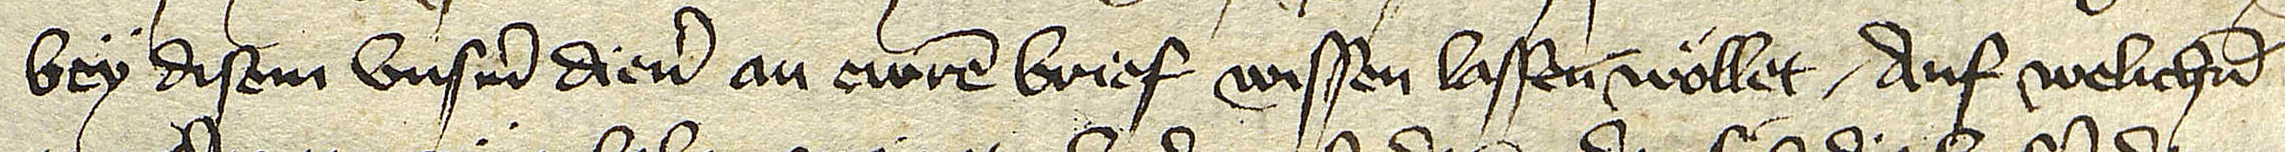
bey diſem vnſm* dien* an ewre* brief wiſſen laſſen wöllet / Auf welichn*
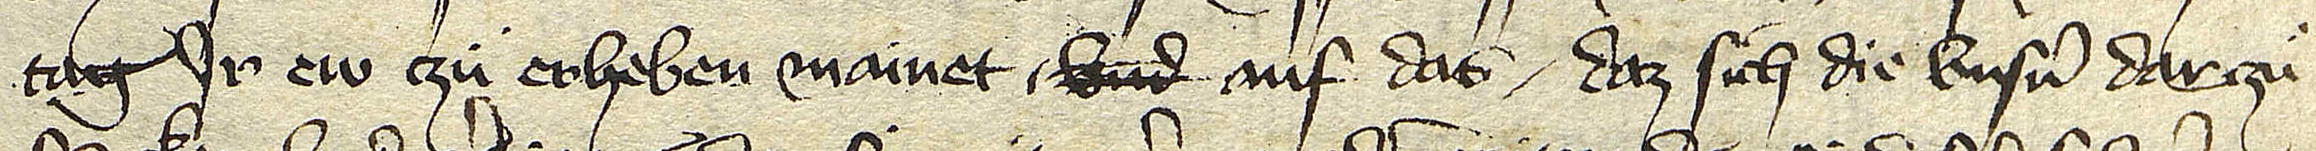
tag Ir ew cʒü erheben mainet / vnd auf das / daʒ ſich vnſn* darcʒü
